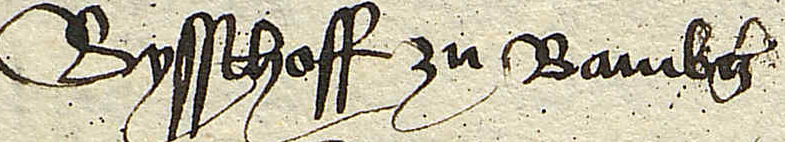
Byſſchoff ʒu Bambg*
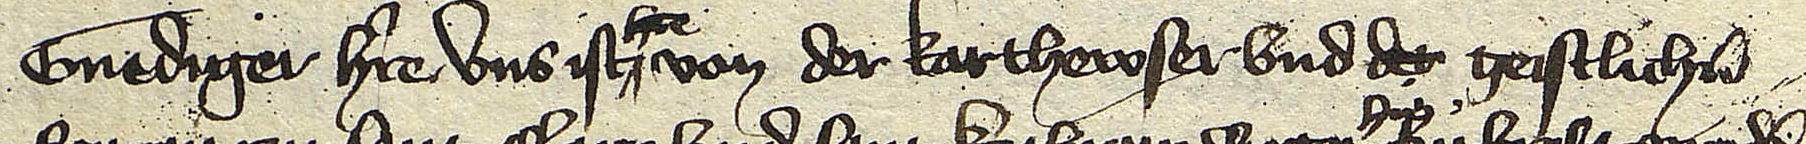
Gnediger h*re / vns iſt von der Karthewſer vnd der geiſtlichn*
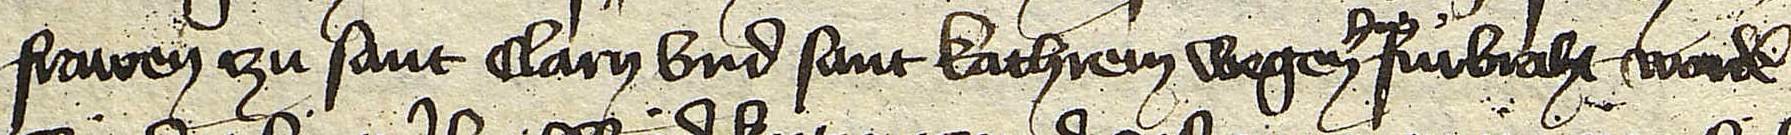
frawen cʒu ſant Clarn vnd ſant Kathrein wegen fürbraht worde*
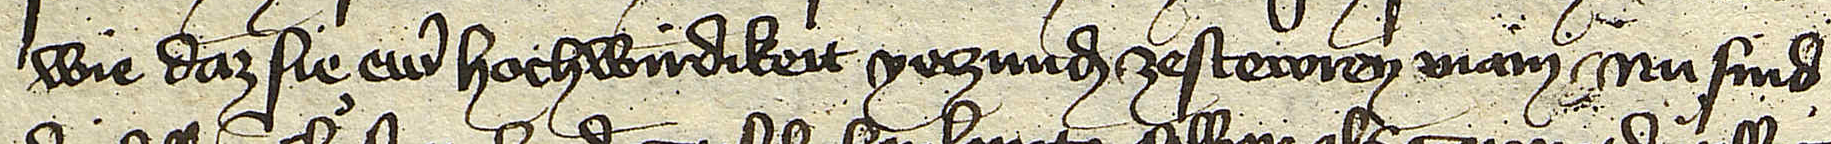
wie daʒ ſie ew* hochwirdikeit yecʒund* cʒeſtewren main / Nu ſind
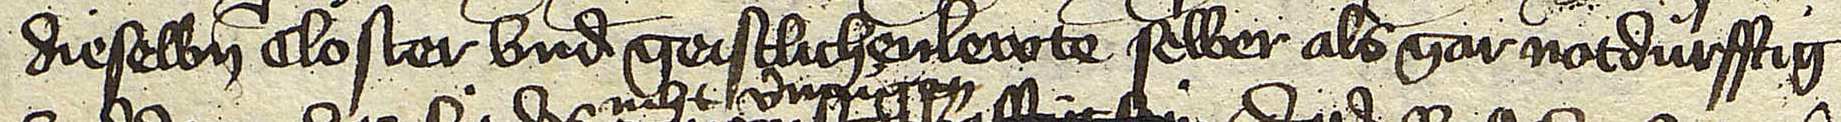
dieſelbn* Clöſter vnd geiſtlichenlewte ſelber als gar notdürfftig
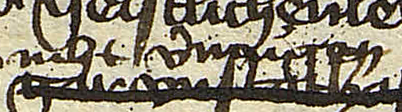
niht v*mügen
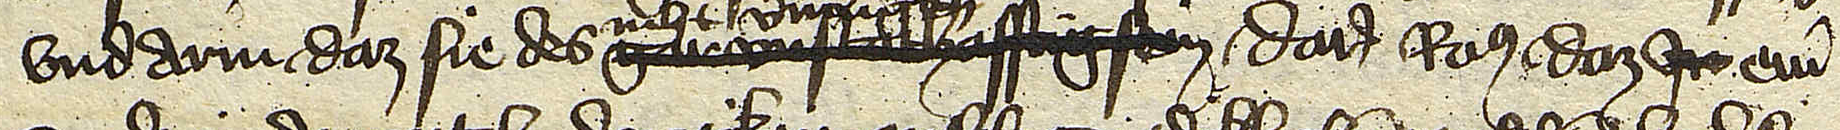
vnd Arm / daʒ ſie des gar vnſtathafftig ſein / dar* Ro* / daʒ In ew*
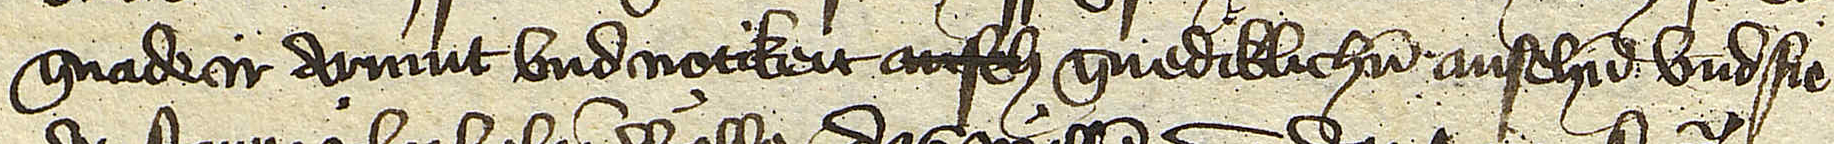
gnade ir Armut vnd notikeit anſeh gnediklichn* anſehn* vnd ſie
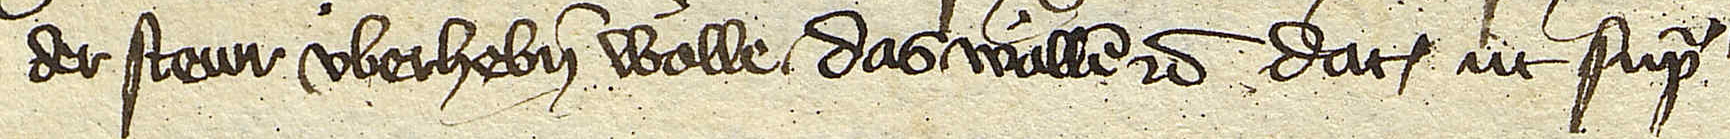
der ſtewr v̈berhebn* wölle / das wölle* ec* dat* ut ſup*
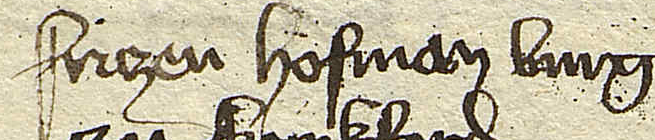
fricʒen hofman burg*
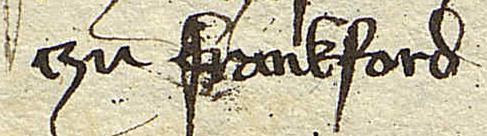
cʒu frankford
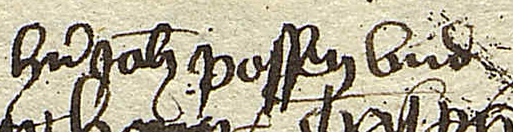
hn* Ioh* Poſſen vnd
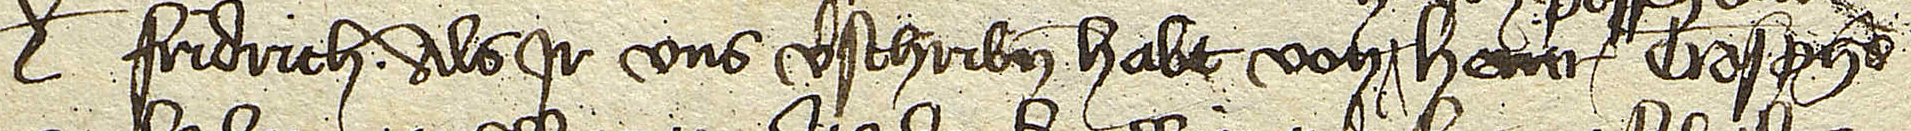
L* fridrich Als Ir vns v*ſchribn* habt von heinr* Troſpg*s
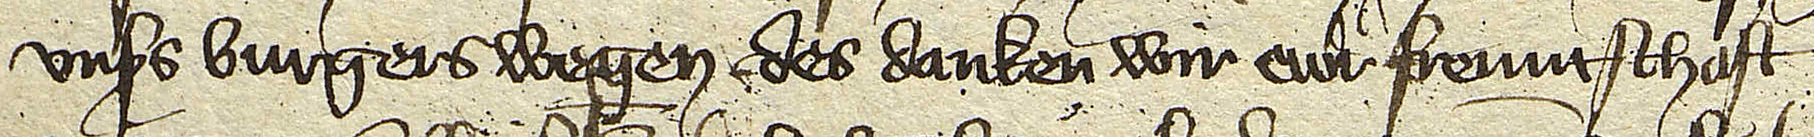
vnſ*s burgers wegen / des danken wir ew*r fruntſchaft
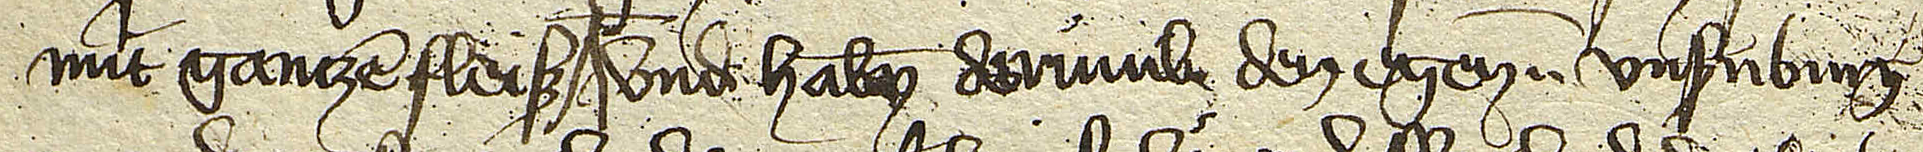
mit gancʒe* fleiſʒ / vnd habn* darümb den egen* ~ vnſ*n burg*
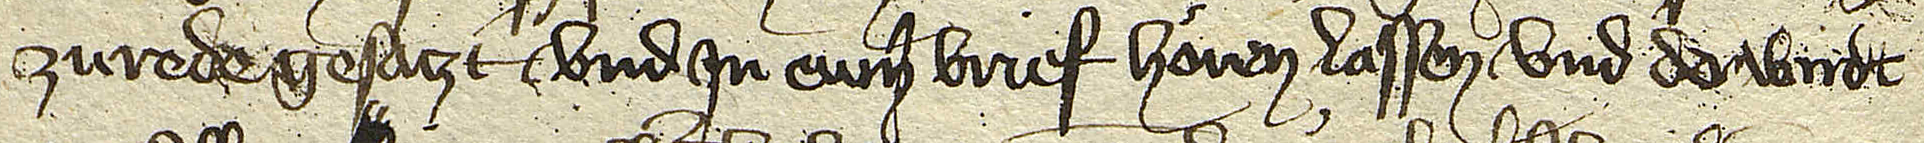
cʒurede geſacʒt / vnd In ewm* brief hören laſſen / vnd der wirdt
